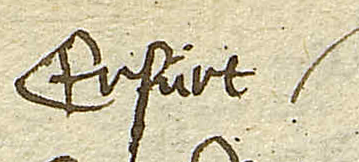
Erfürt /
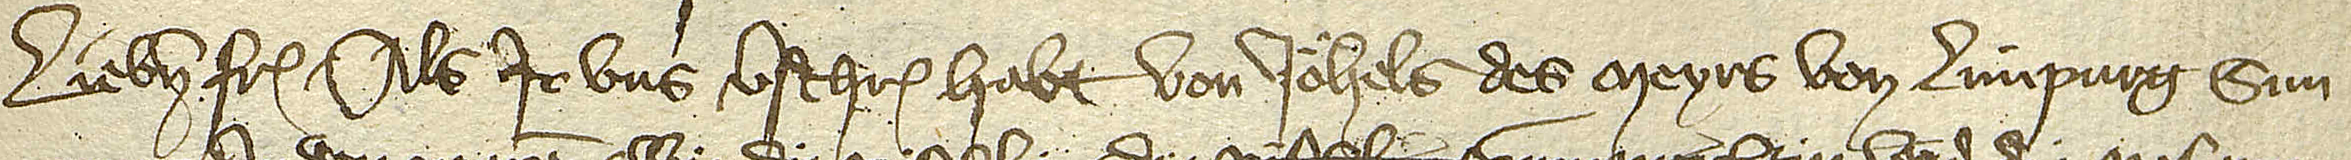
Liebn* fr* / Als Ir vns v*ſchr* habt von Iöhels des Meyrs von Limpurg Sun
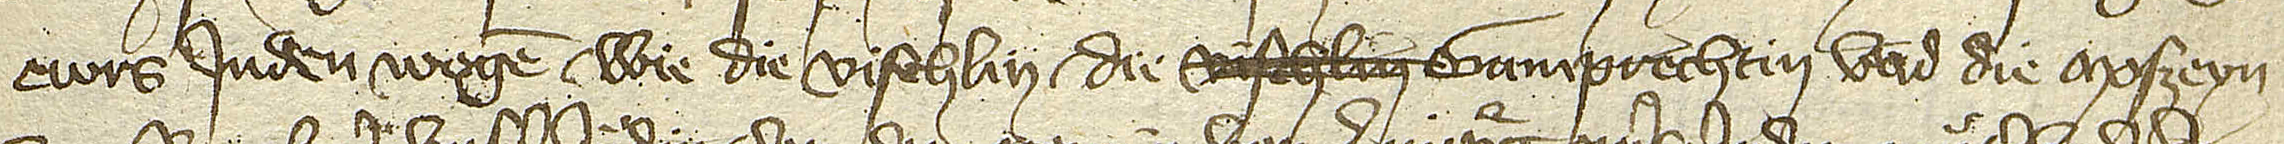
ewrs Iuden wege* / wie die viſchlin / die viſchlin Gumprechtin vnd die Moſʒeyn
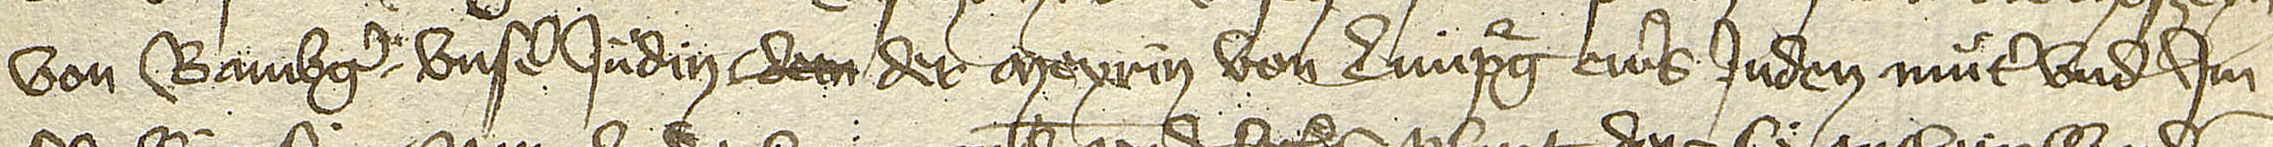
von Bambg* / vnſe* Iüdin / dem der Meyrin von Limp*g ew*s Iuden müt* vnd Im
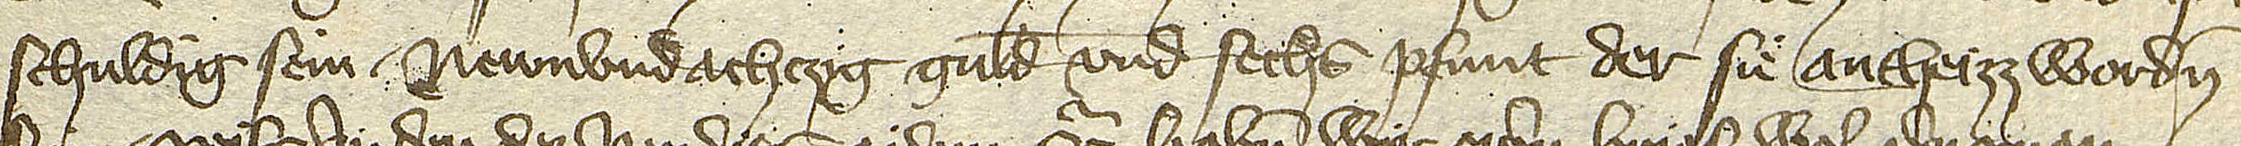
ſchuldig ſein / Newnvndachcʒig guld* vnd ſechs pfunt der ſie anlheiʒʒ wordn*
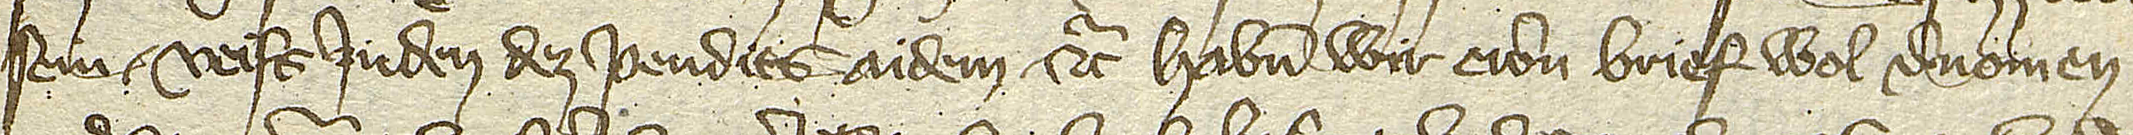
ſein / veifs Iuden deʒ pendits aidem / ec* habn* wir ew*n brief wol v*nomen
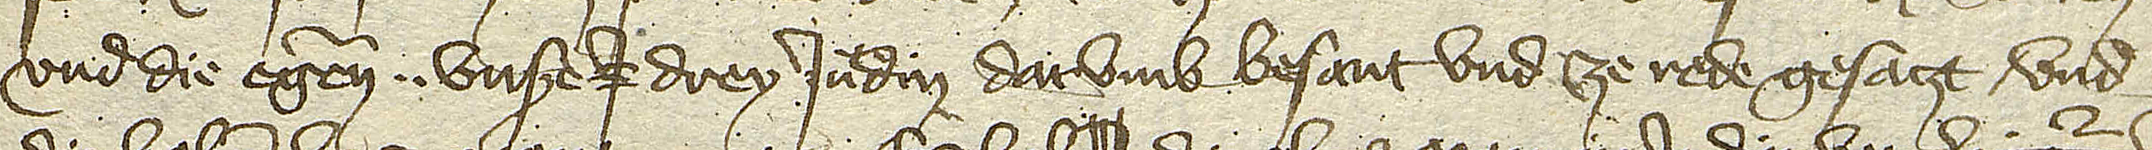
vnd die egen* ~ vnſ*e I drey Iüdin darvmb beſant vnd cʒe rede geſacʒt / vnd
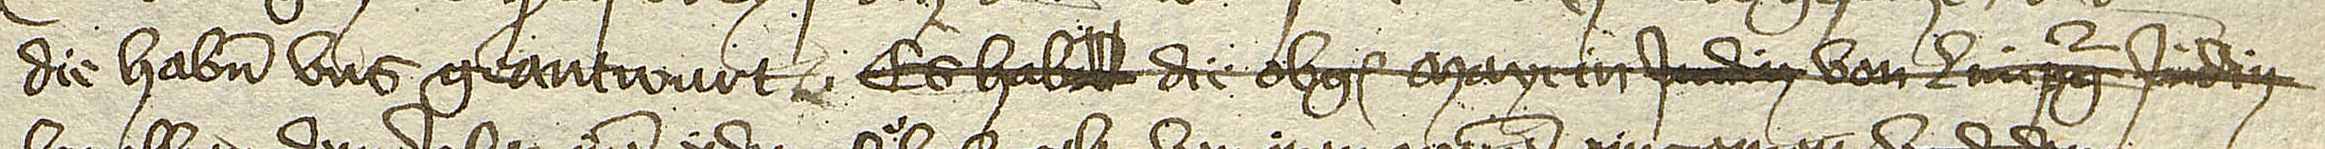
die habn* vns geantwurt . Es habn* die obg* Mayrin Iudin von Limp*g Iüdin
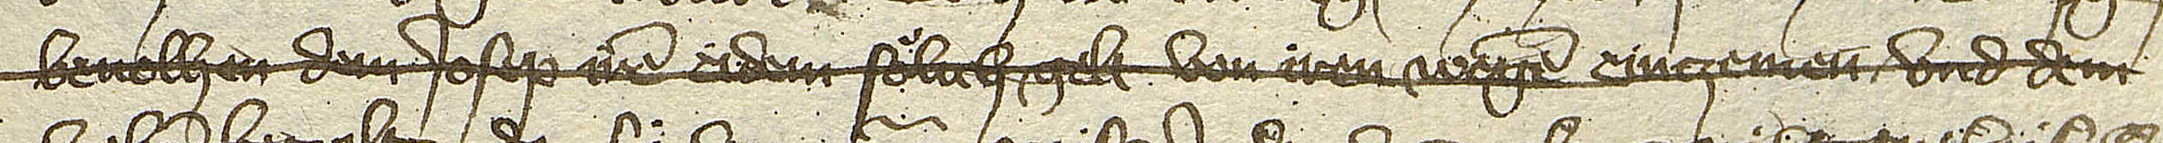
beuolhen dem Ioſep ire* eidem ſölich gelt von irem wege* eincʒemen / vnd dem
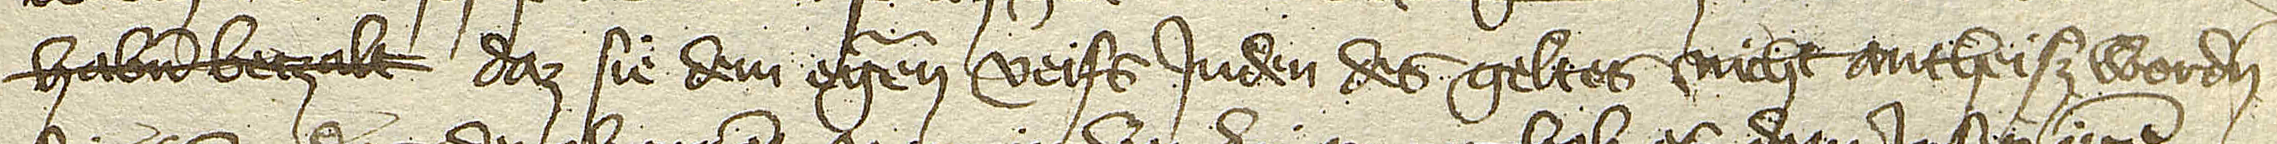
habn* becʒalt daʒ ſie dem egen* veifs Iuden des geltes nicht antheiſʒ wordn*
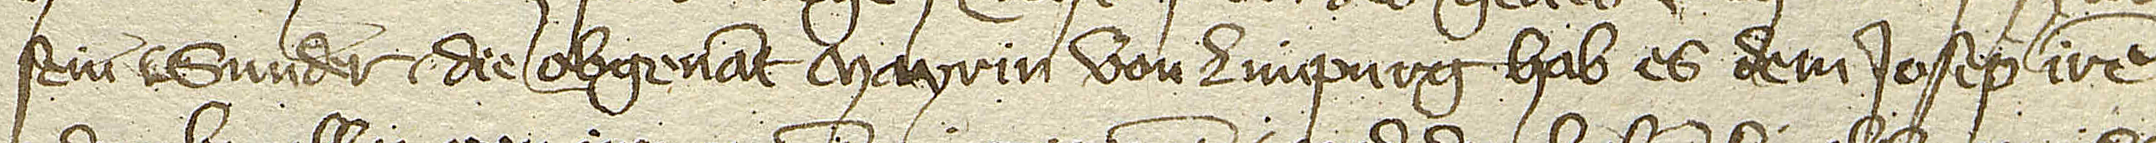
ſein / Sunder / die obgena*t Mayrin von Limpurg hab es dem Ioſep ire*
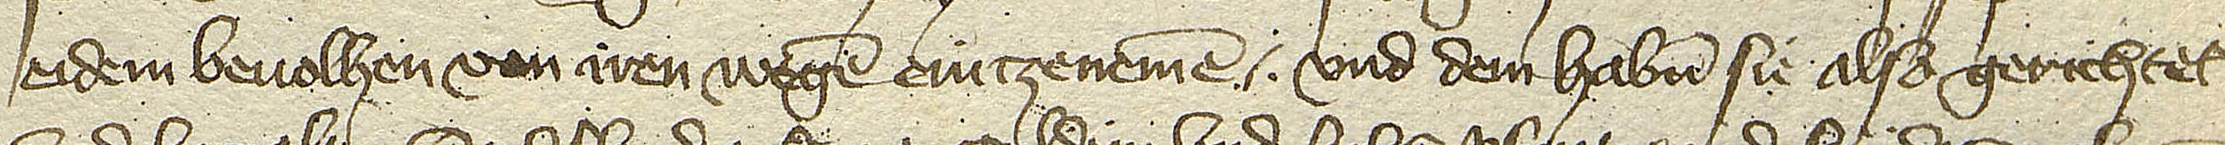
eidem beuolhen von iren wege* eincʒeneme* / . vnd dem habn* ſie alſo gerichtet
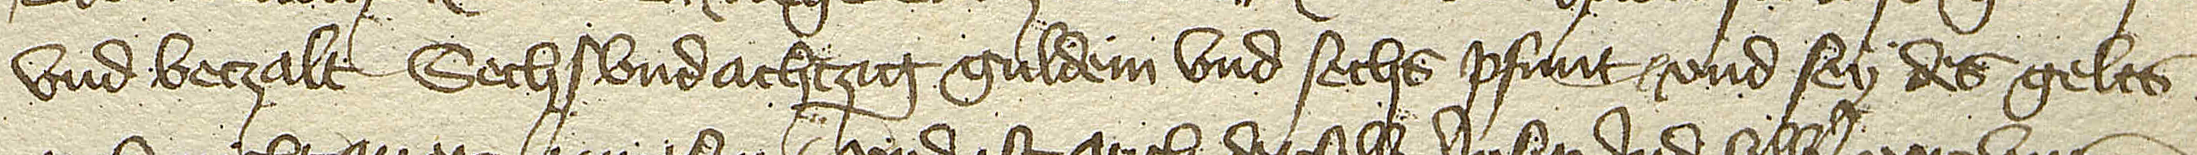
vnd becʒalt Sechſvndachcʒig guldein vnd ſechs pfunt / vnd ſey des gelts
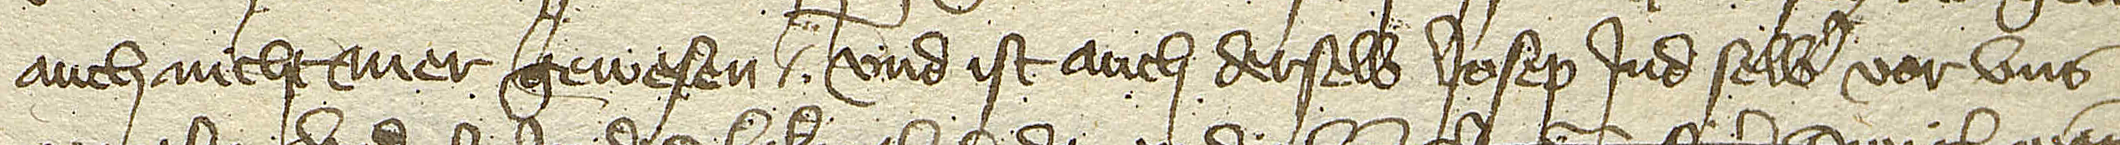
auch nicht mer geweſen / . vnd iſt auch derſelb Ioſep Iud ſelb* vor vns
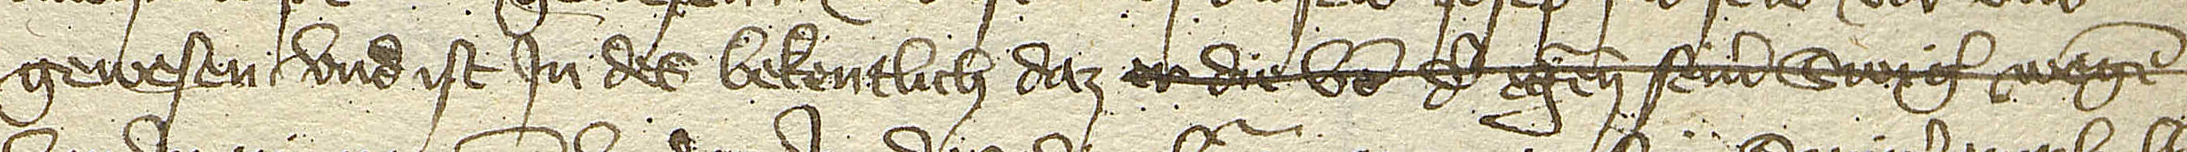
geweſen / vnd iſt In des bekentlich daʒ er die vo* d* egen* ſein* Swig* wege*
